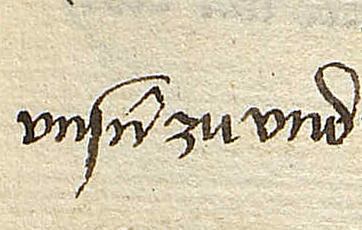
vnſn* ʒu vnd
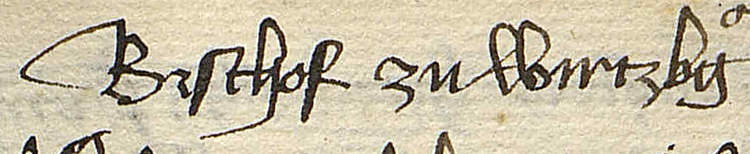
Biſchof ʒu Wircʒb*g
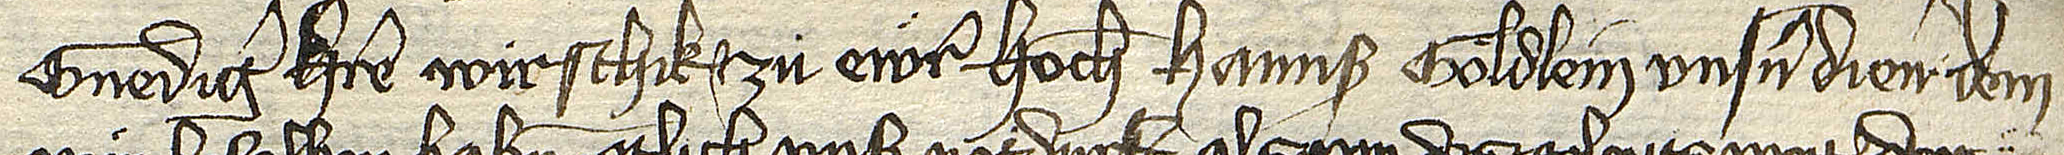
Gnedig* h*re wir ſchik* ʒu eẅr* hoch* Hannſ* Göldlein vnſn* dien* dem
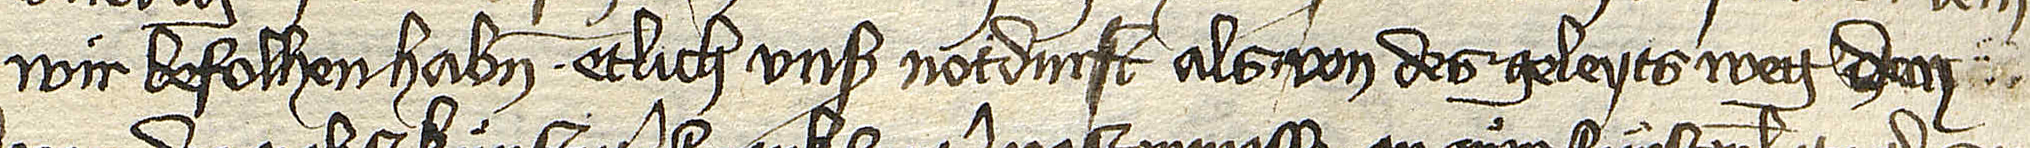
wir befolhen habn* . etlich vnſ* notdurft als von des geleyts weg* dem
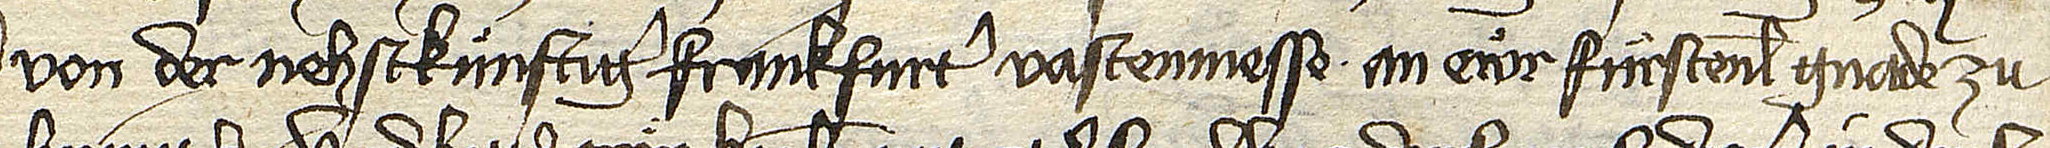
von der nehſtkünftig* frankfurt* vaſtenmeſſe . an eẅr fürſtenl* gnade ʒu
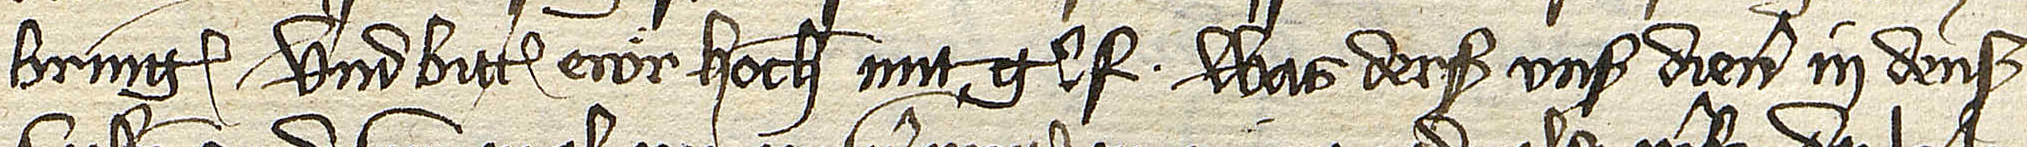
bring* / Vnd bitt* eẅr hoch* mit g* f* was derſ* vnſ* dien* in denſ*
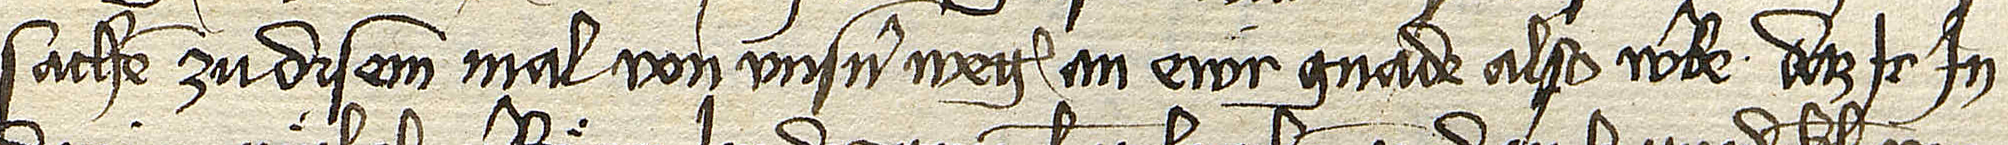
ſache* ʒu diſem mal von vnſn* weg* an eẅr gnade alſo w*be . daʒ Ir In
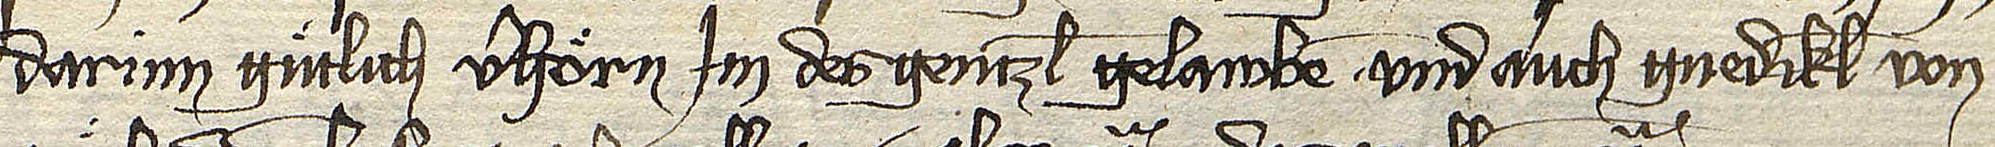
darinn gütlich v*hören Im des gencʒl* gelawbe* / vnd auch gnedikl* von
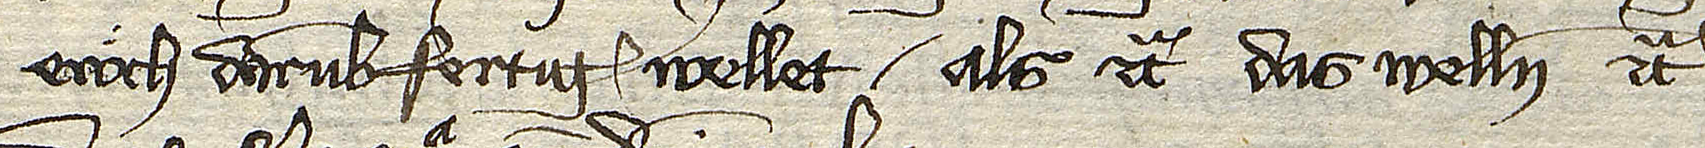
eẅch darub* fertig* wellet / als ec* das welln* ec*
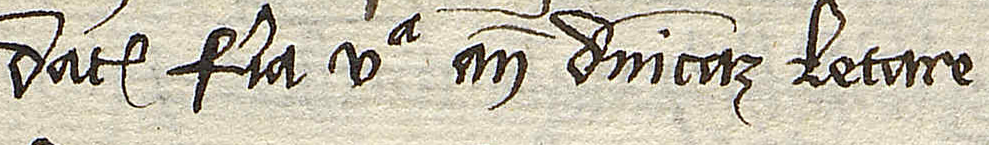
Dat* fi*a v* an* dni*ca* Letare
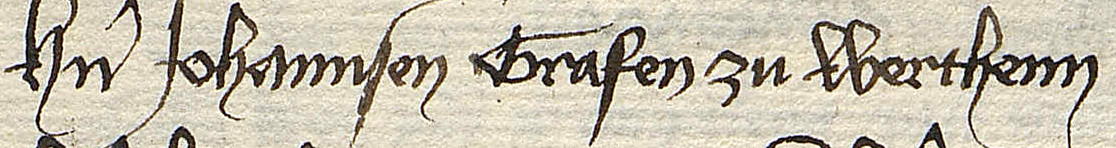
Hn* Iohannſen Grafen ʒu Wertheim
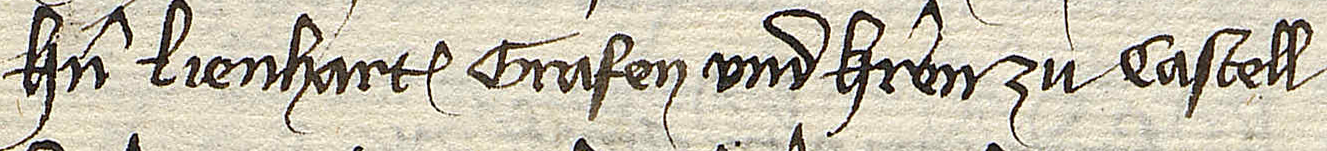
Hn* lienhart* Grafen vnd H*ren ʒu Caſtell
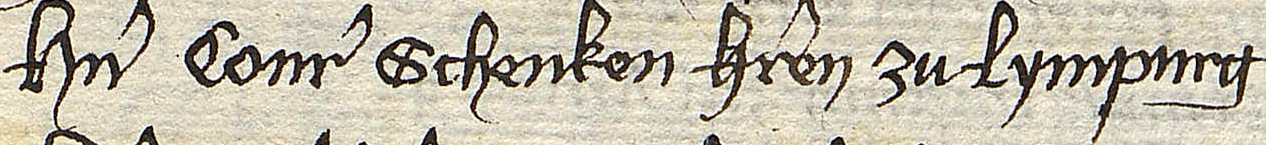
Hn* Conr* Schenken h*ren ʒu Lympurg
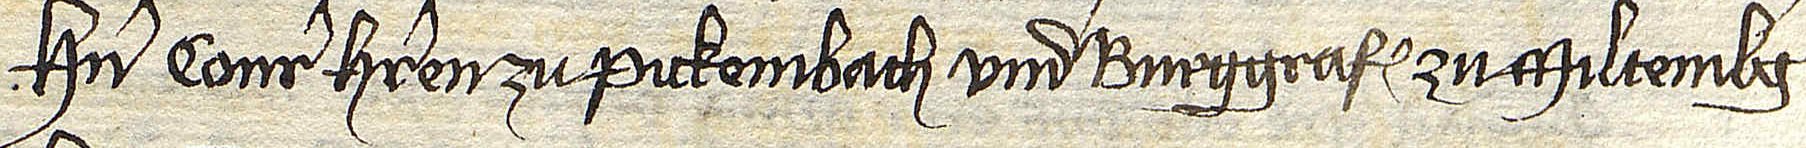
Hn* Conr* h*ren ʒu Pickembach vnd Burggraf* ʒu Miltemb*g
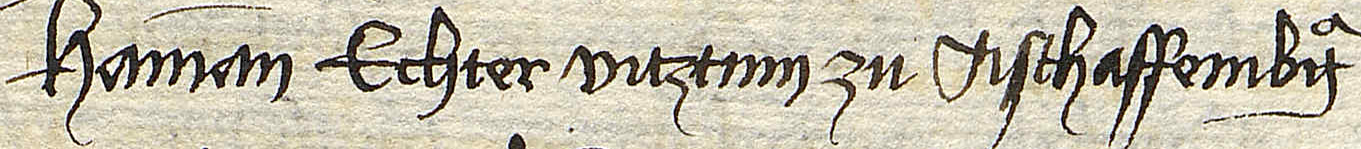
Ham*an Echter vicʒtum ʒu Aſchaffemb*g
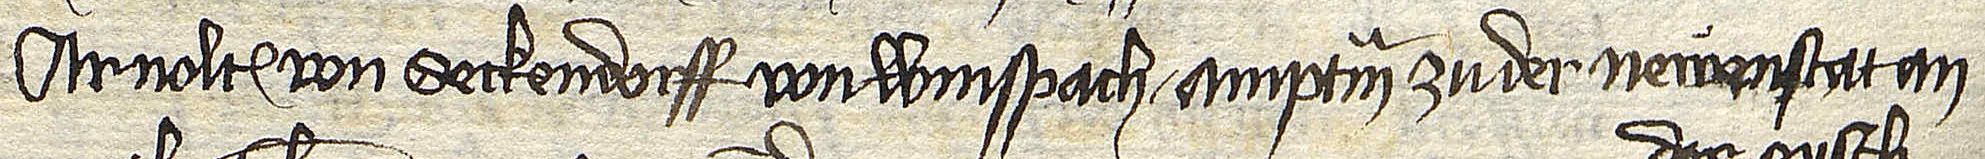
Arnolt* von Seckendorff von Winſpach / amptm* ʒu der neẅenſtat an
